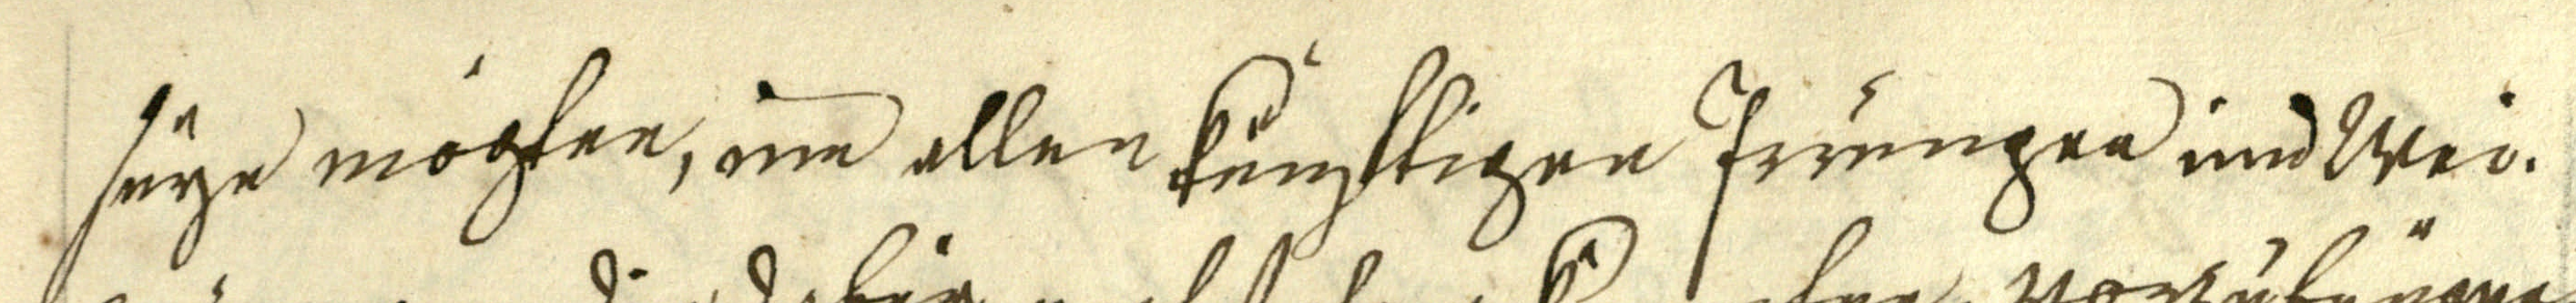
seÿn mögten, um allen künftigen Irrungen und Wei¬
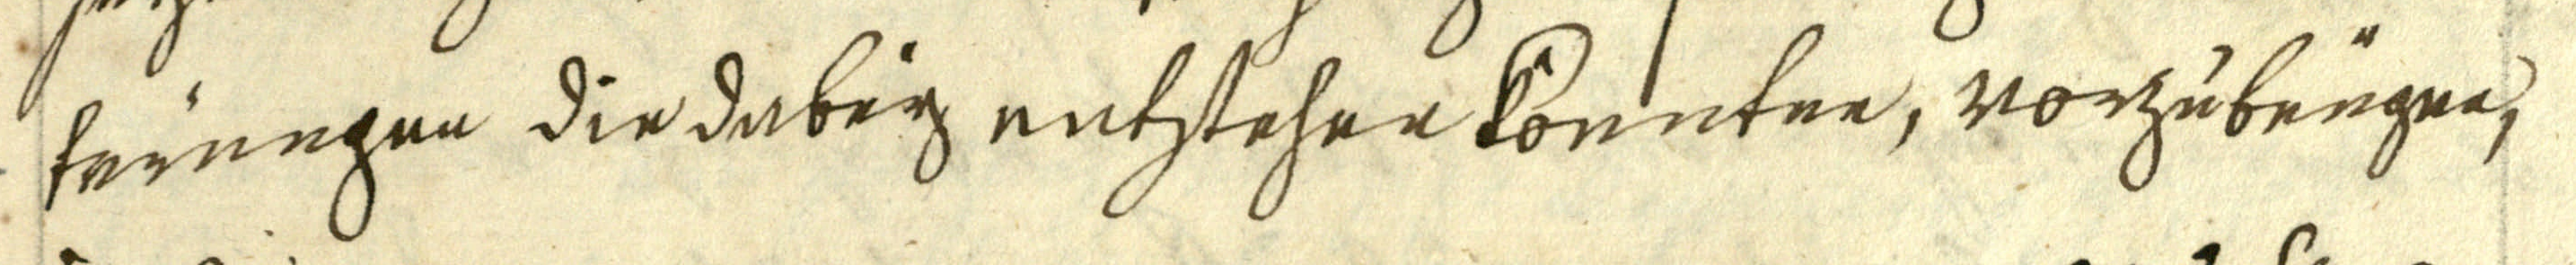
terungen die dabeÿ entstehen könnten, vorzubeugen,
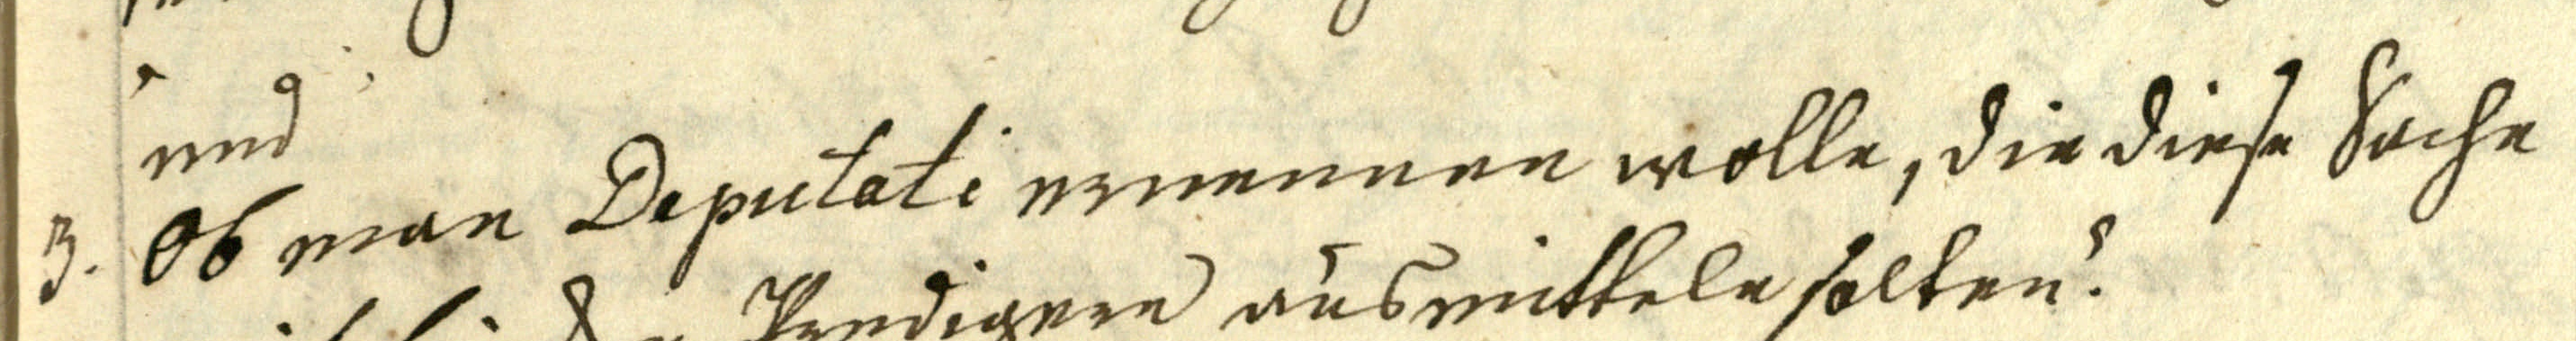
3. Ob man Deputati ernennen wolle, die diese Sache
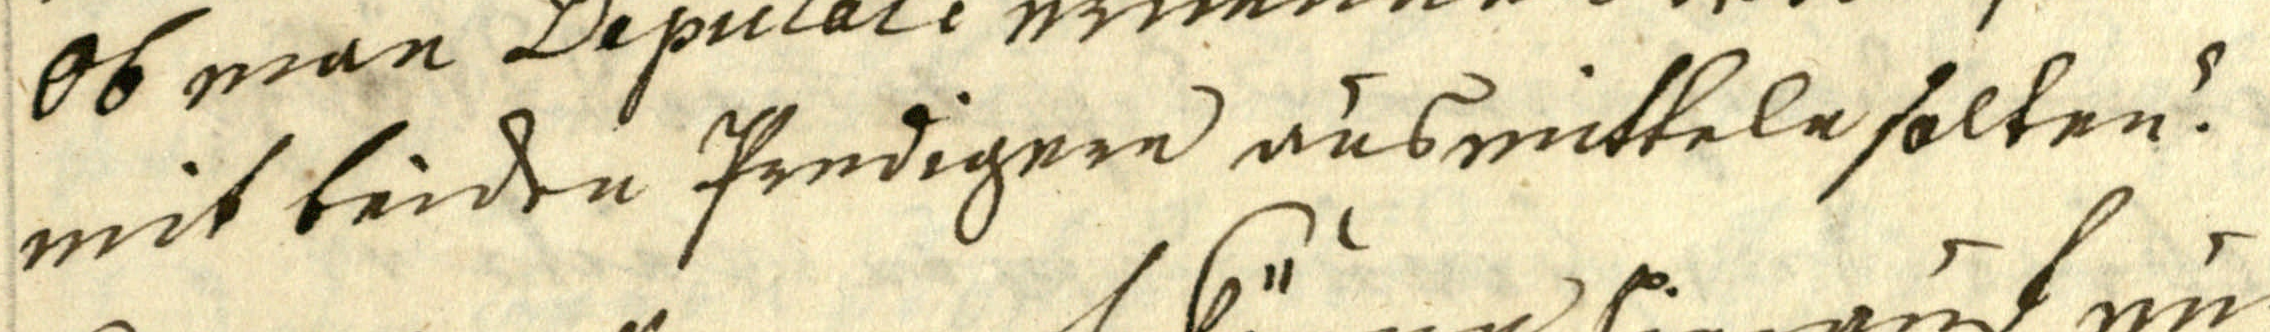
mit beiden Predigern ausmitteln solten?
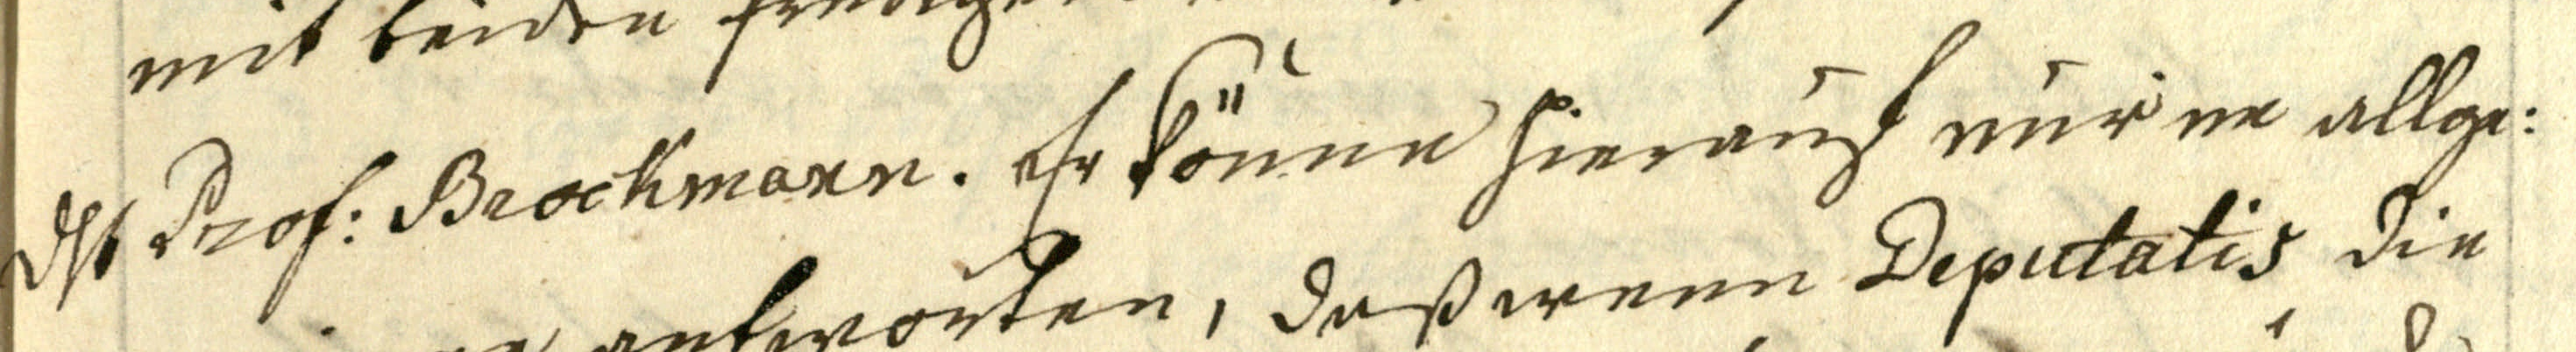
dh Prof. Brockmann. Er könne hierauf nur im allge¬
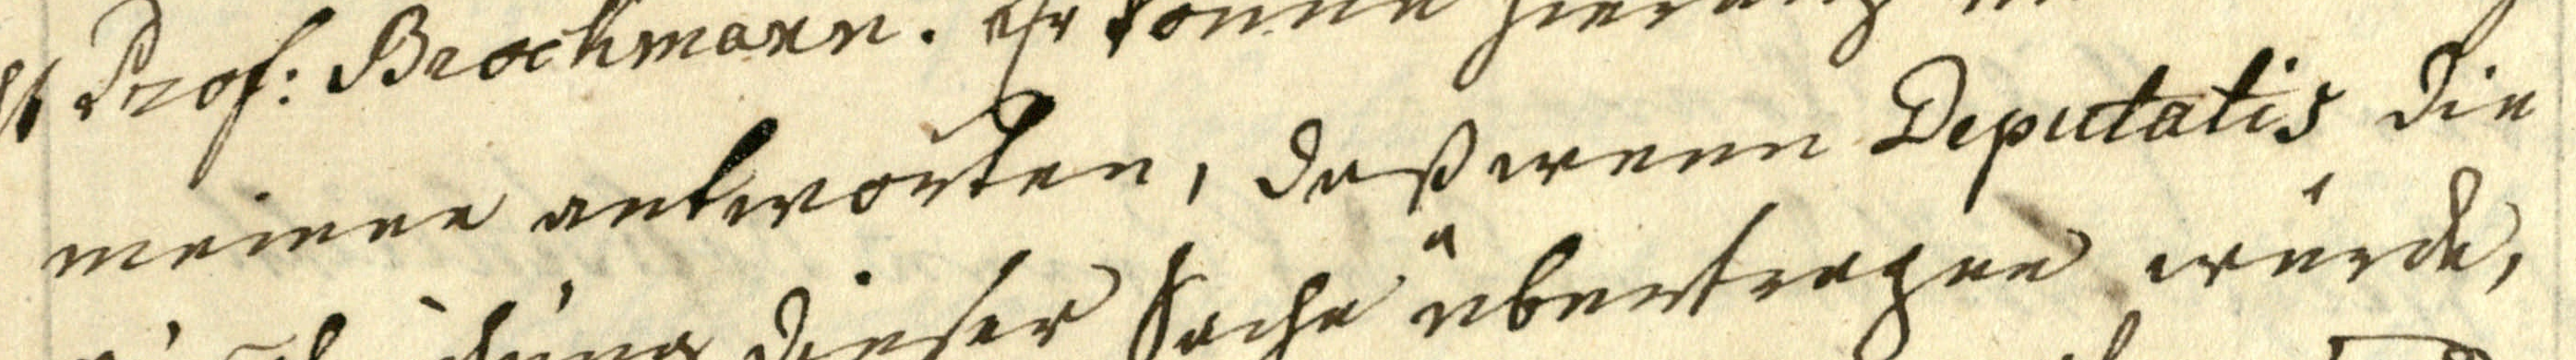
meinen antworten, daß wenn Deputatis die
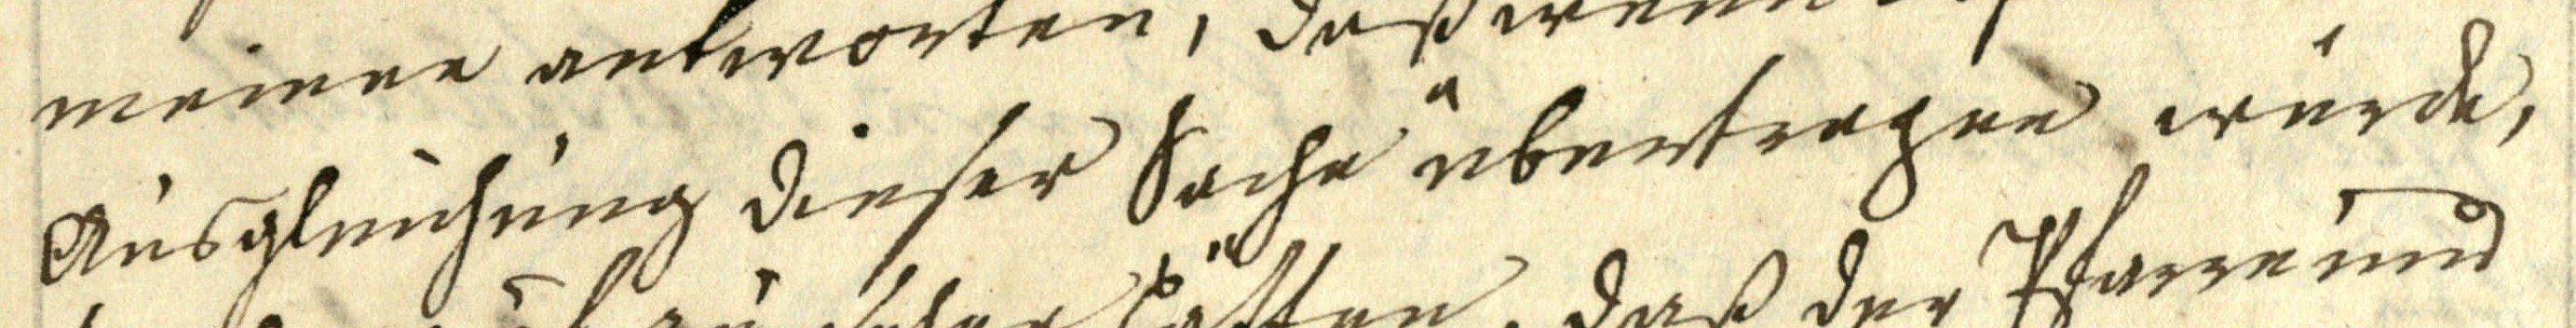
Ausgleichung dieser Sache übertragen würde,
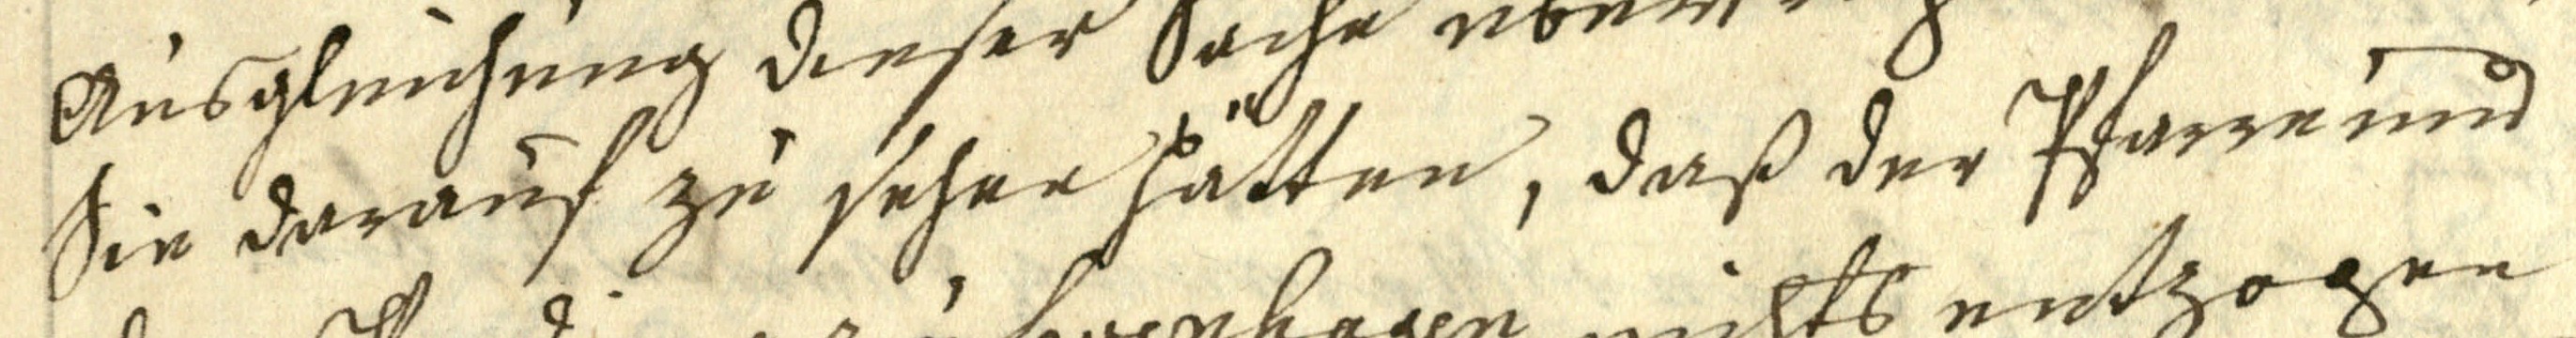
Sie darauf zu sehen hätten, daß der Pfarre und
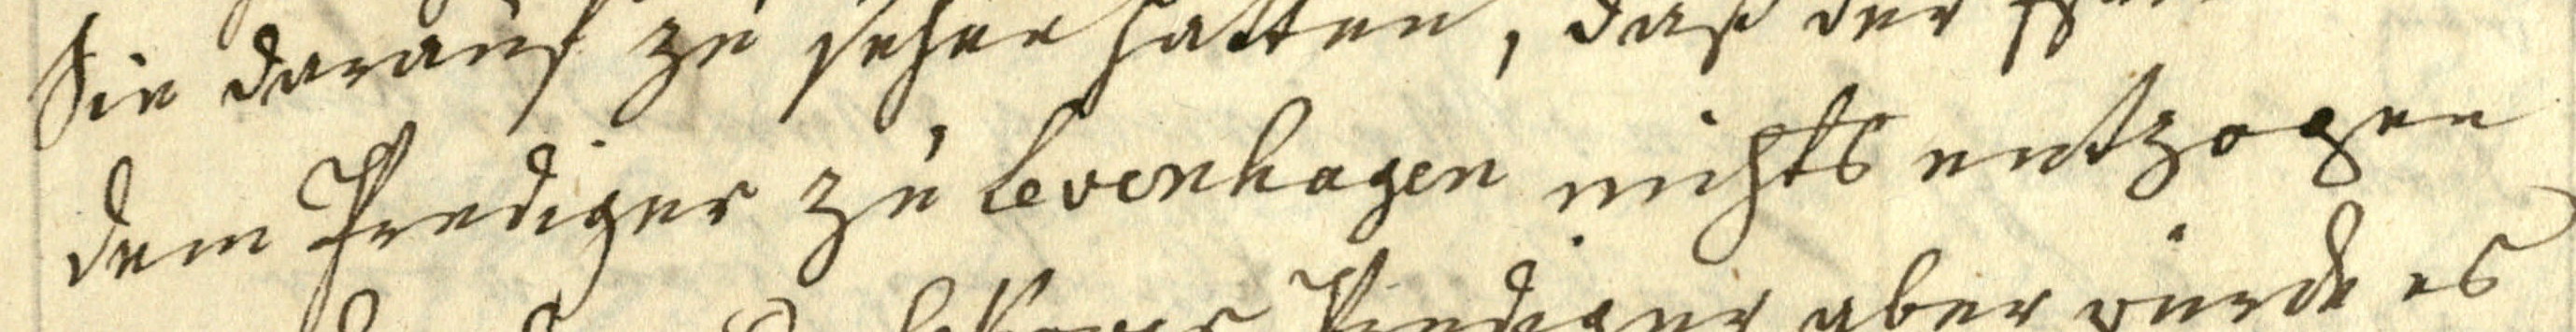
dem Prediger zu Levenhagen nichts entzogen
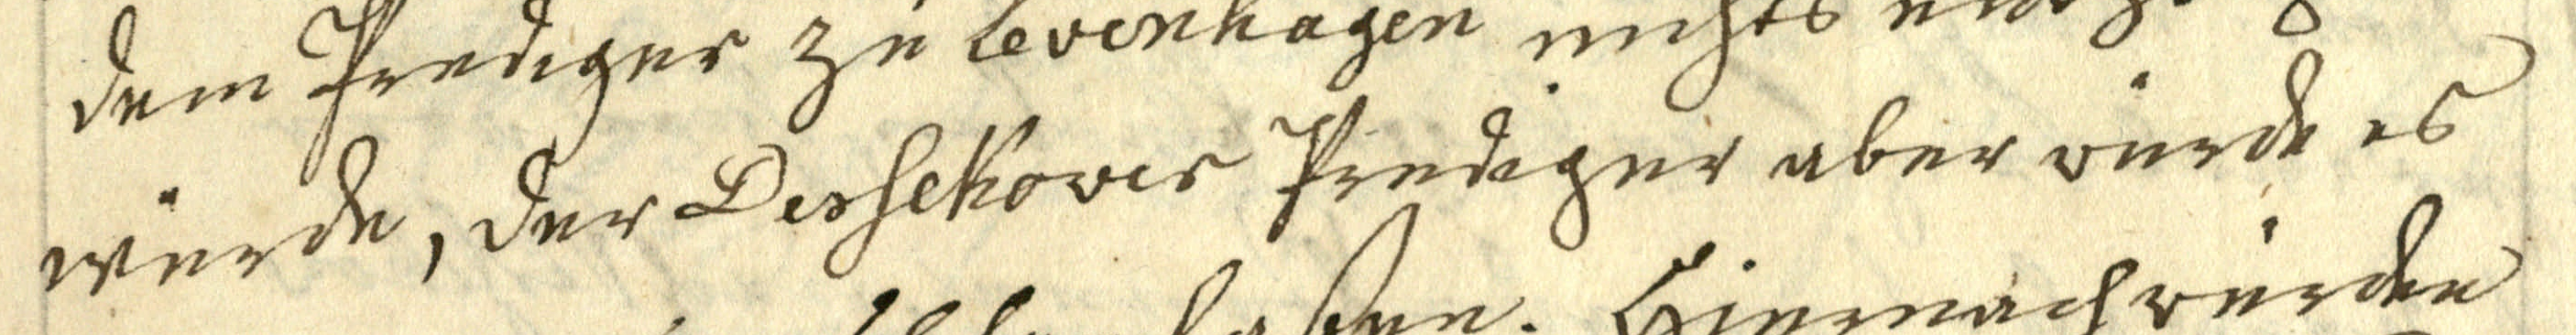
würde, der Dersekower Prediger aber würde es
